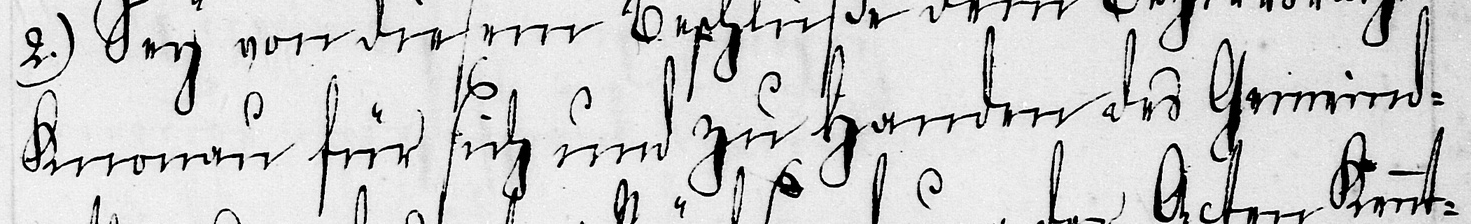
Knonau für sich und zu Handen des Gemeind¬
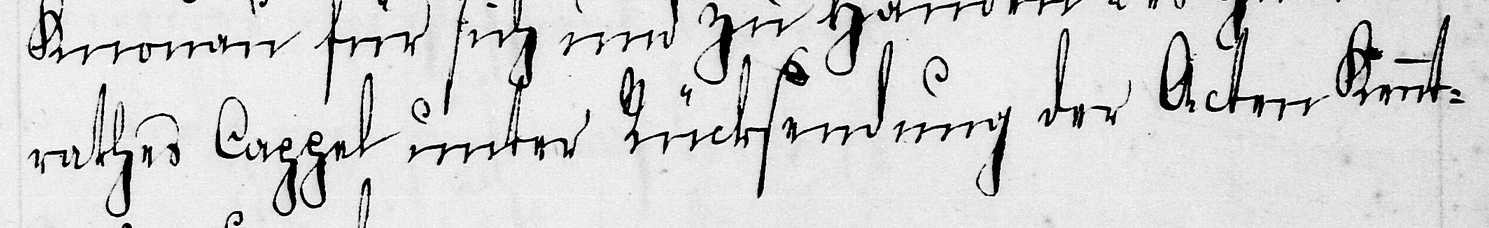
rathes Cappel unter Rücksendung der Acten Kennt¬
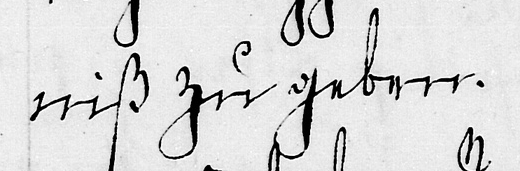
niß zu geben.
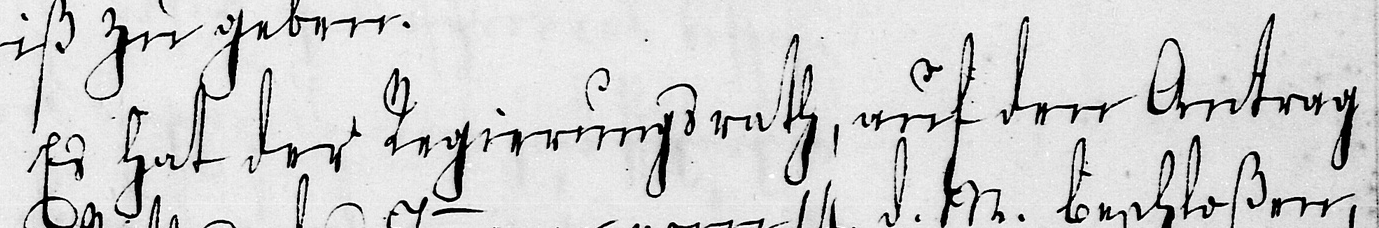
Es hat der Regierungsrath, auf den Antrag
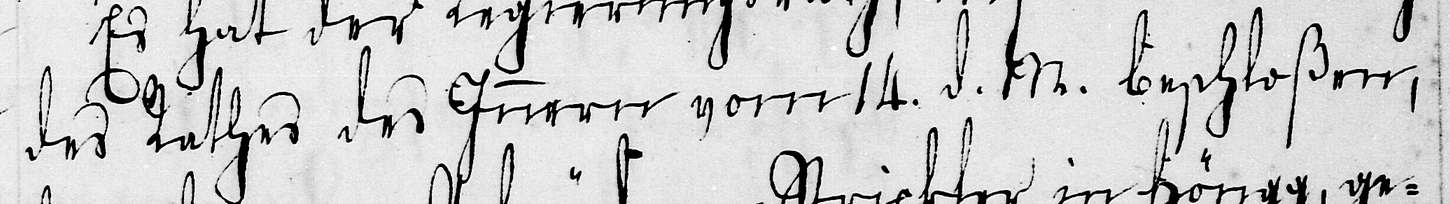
des Rathes des Innern vom 14. d. M. beschloßen,
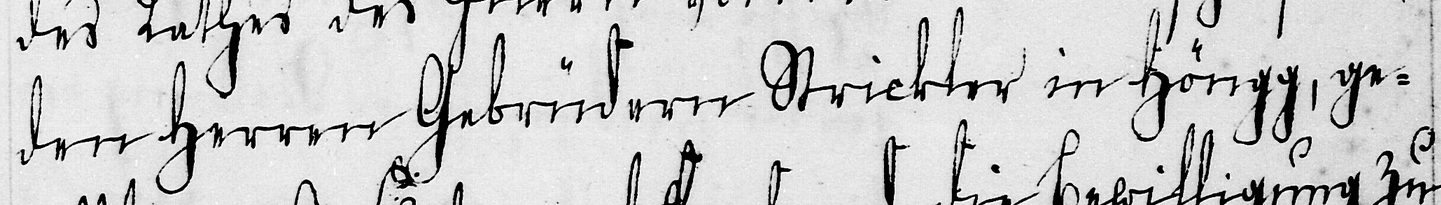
den Herren Gebrüdern Strickler in Höngg, ges¬
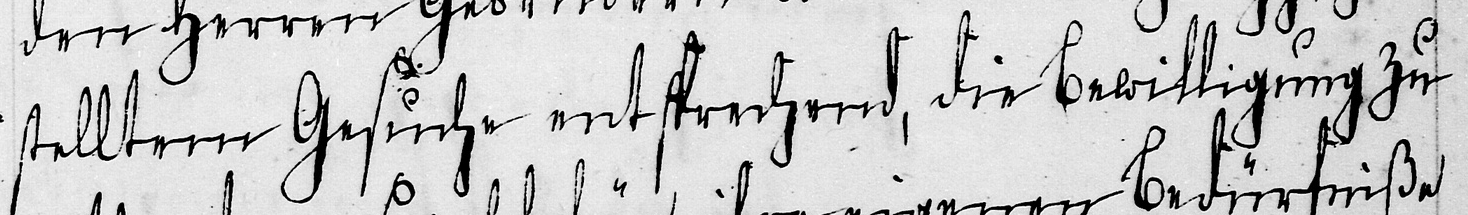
telltem Gesuche entsprechend, die Bewilligung zu
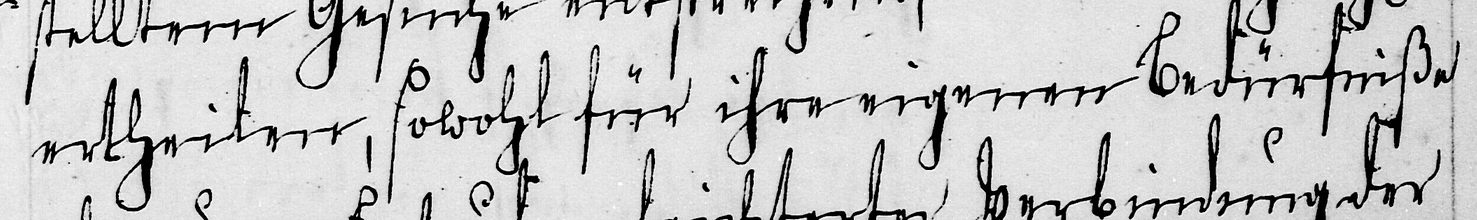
ertheilen, sowohl für ihre eigenen Bedürfniße
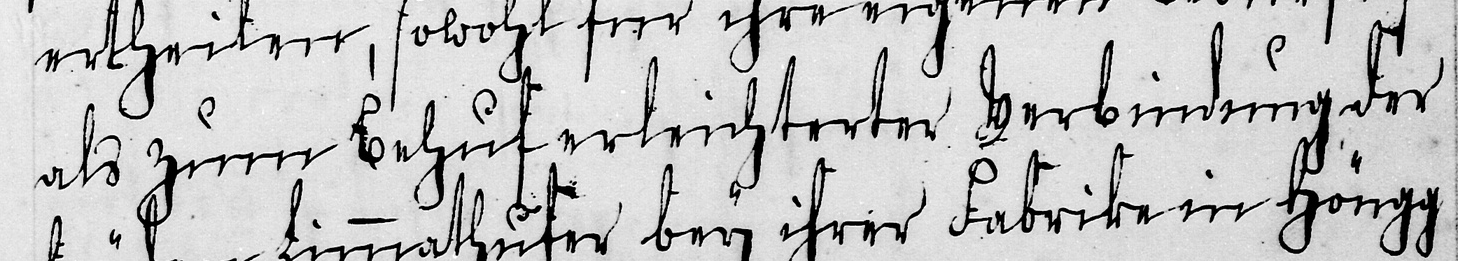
als zum Behuf erleichterter Verbindung der
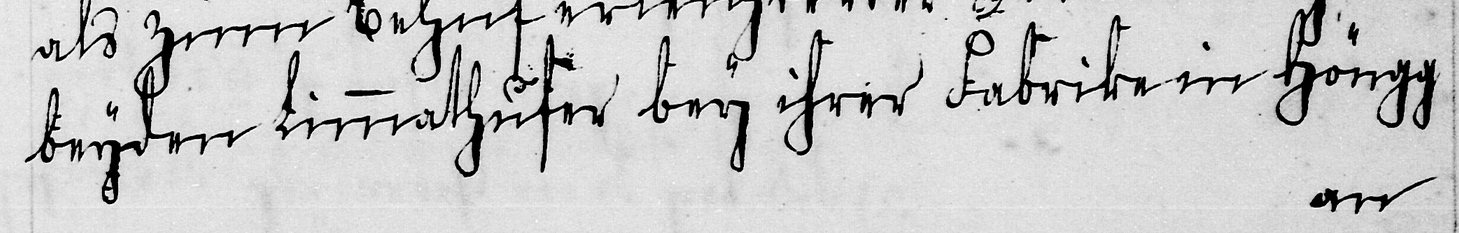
beyden Limmathufer bey ihrer Fabrike in Höngg
